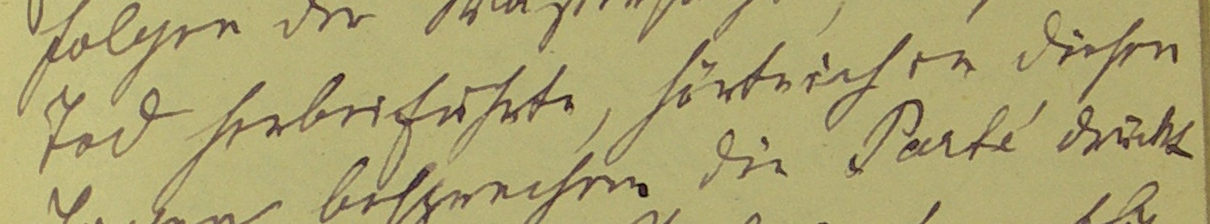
Tod herbeiführte, hörte ich in diesen
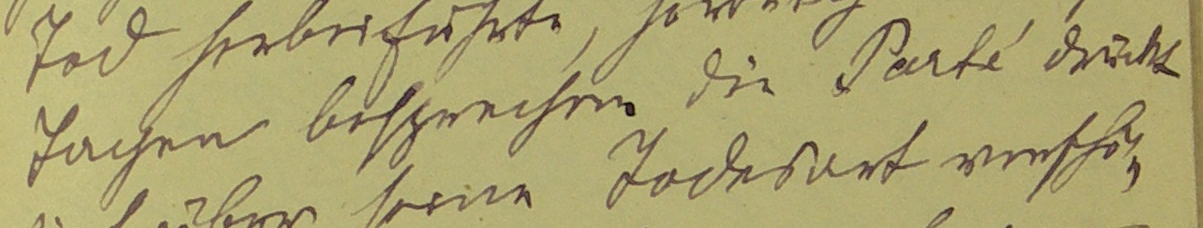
Tagen besprechen. Die ??? drückt
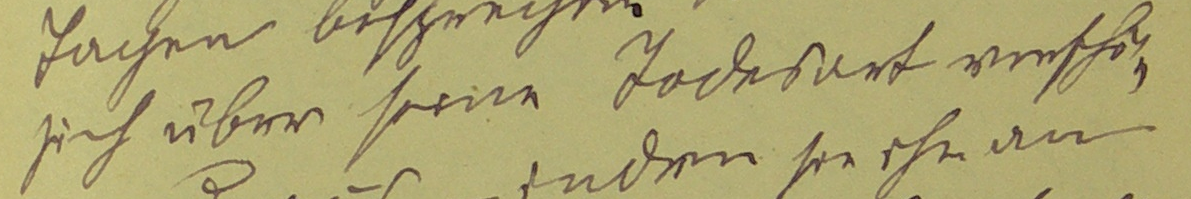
sich über seine Todesart verschö¬
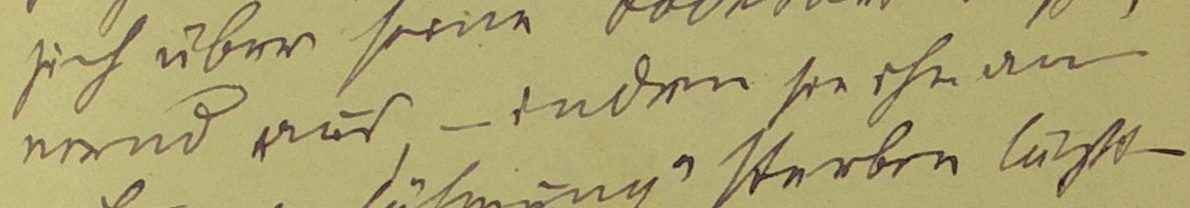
nernd aus,- indem sie ihn an
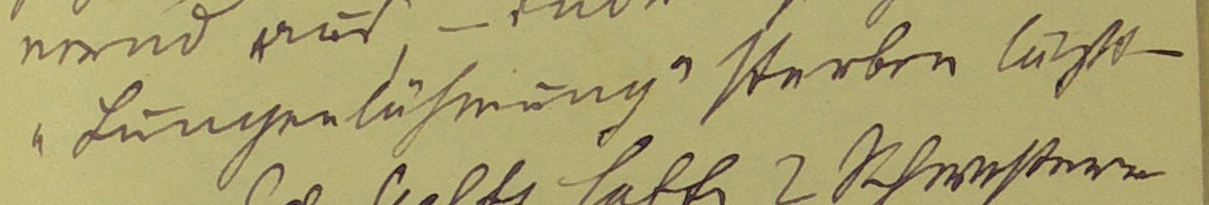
„Lungenlähmung“ sterben läßt.—
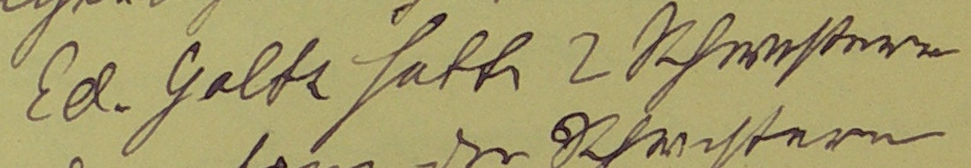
??? ??? hatte 2 Schwestern
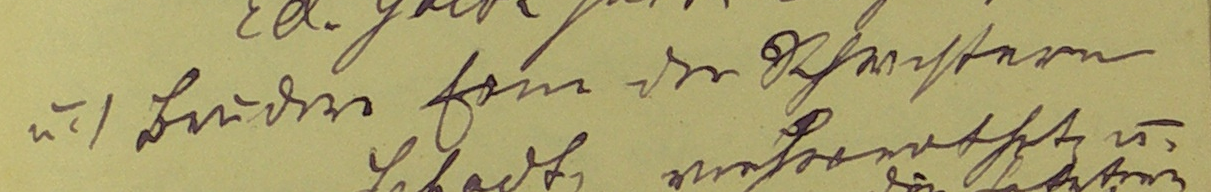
u. 1 Bruder. Eine der Schwestern
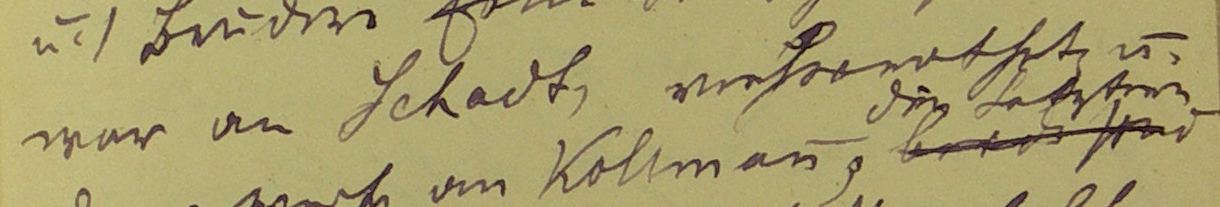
war an ??? verheirathet u.
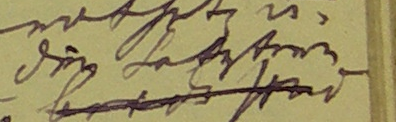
die Leztere
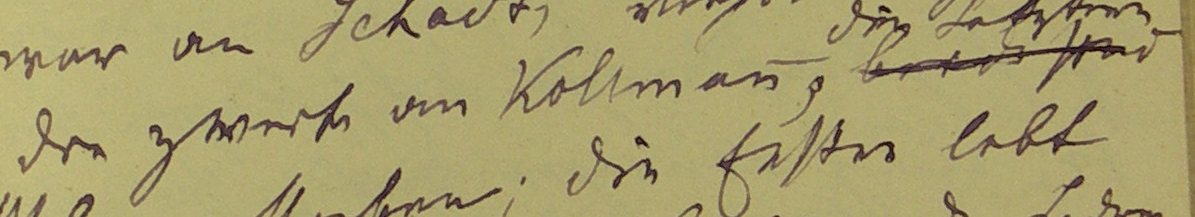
die zweite an ??? ,
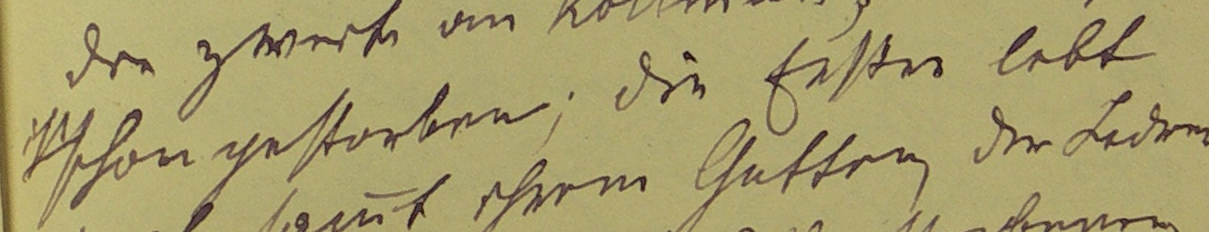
ist schon gestorben; die Erstre lebt
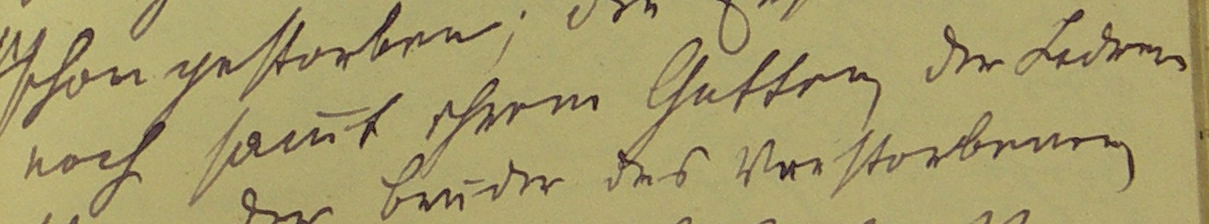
noch samt ihrem Gatten, der Lederer
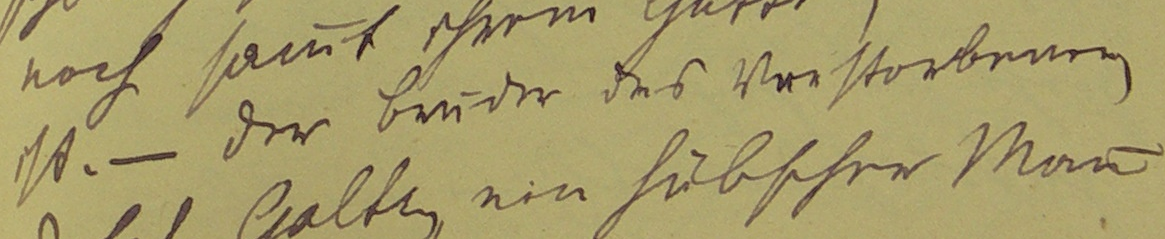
ist.- Der Bruder des Verstorbenen,
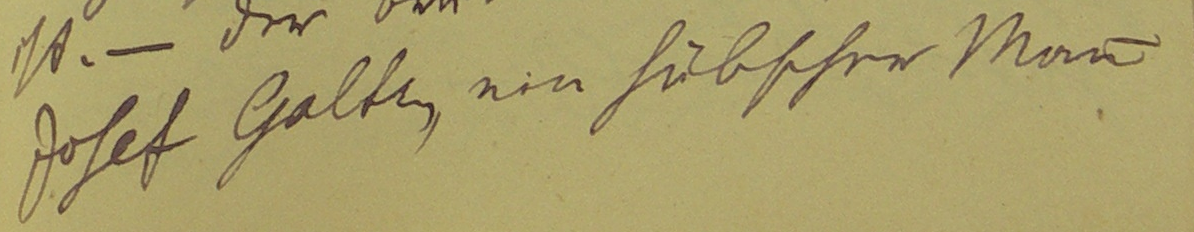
??? ??? ,ein hübscher Mann
